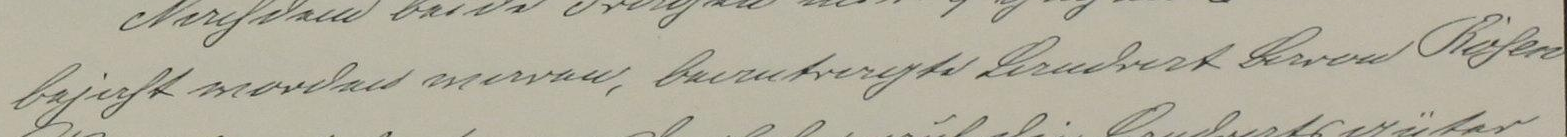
bejaht worden waren, beantragte Landrat Baron Rosen-
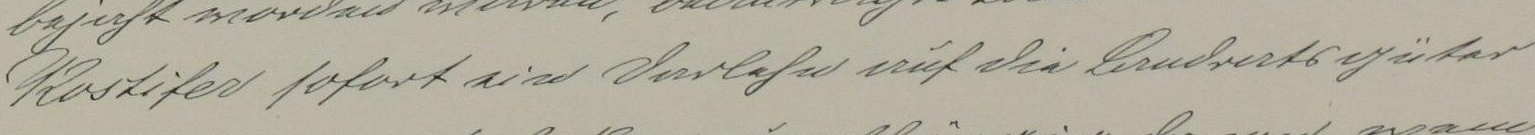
Kostifer sofort ein Darlehn auf die Landratsgüter
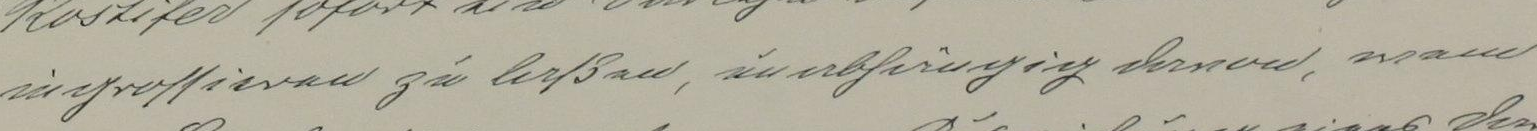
ingrossieren zu laßen, unabhängig davon, wem
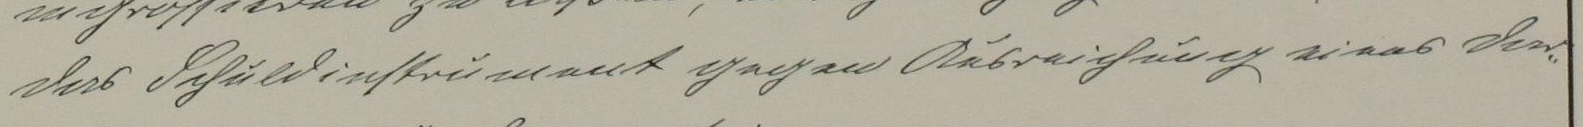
das Schuldinstrument gegen Ausreichung eines Dar-
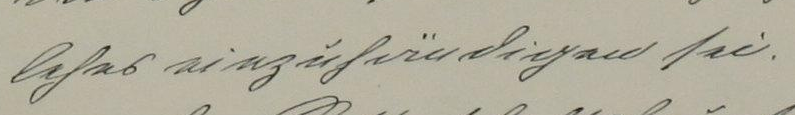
lehns einzuhändigen sei.
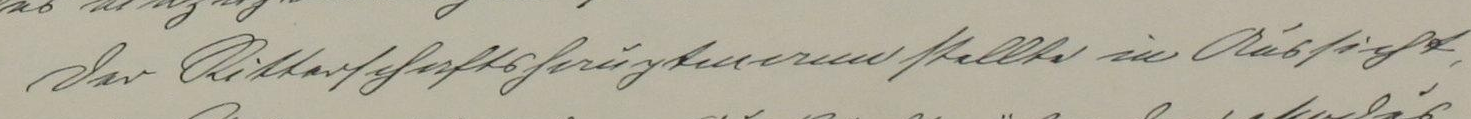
Der Ritterschaftshauptmann stellte in Aussicht,
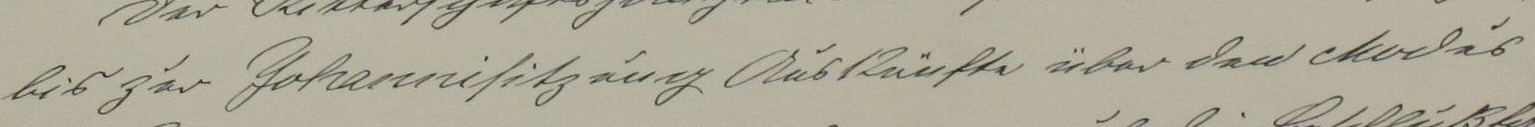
bis zur Johannisitzung Auskünfte über den Modus
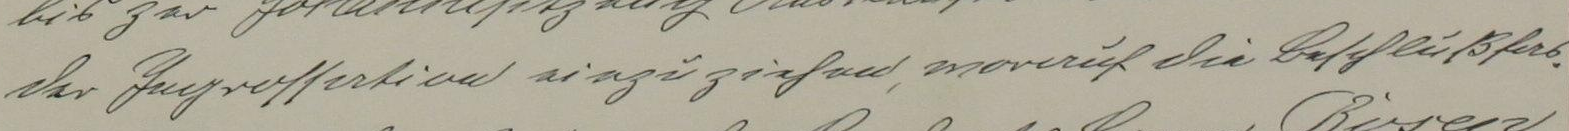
der Ingrossation einzuziehen, worauf die Beschlußfas-
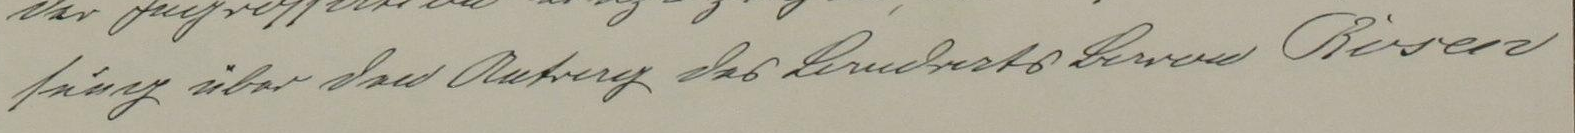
sung über den Antrag des Landrats Baron Rosen
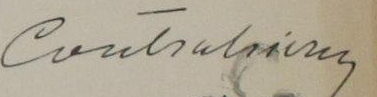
Contrahierung
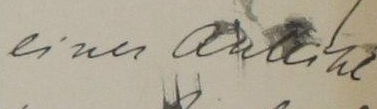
einer Anleihe
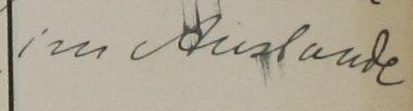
im Auslande
